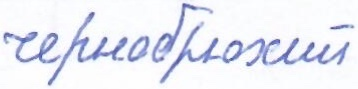чернобрюхий
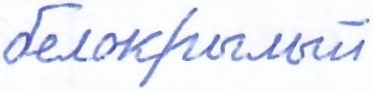белокрылый
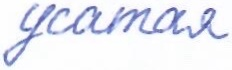усатая
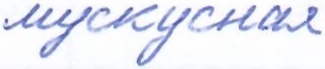мускусная
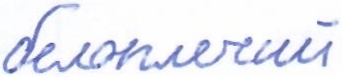белоплечий
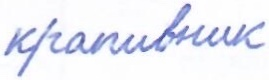крапивник
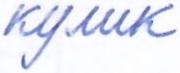кулик
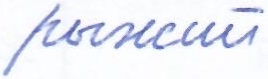рыжий
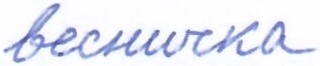весничка
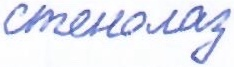стенолаз
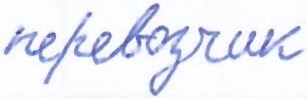перевозчик
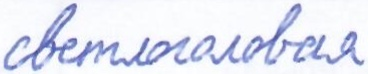светлоголовая
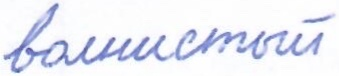волнистый
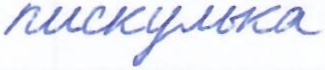пискулька
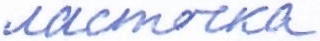ласточка
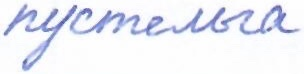пустельга
